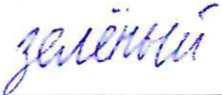зелёный
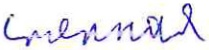степная
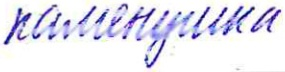каменушка
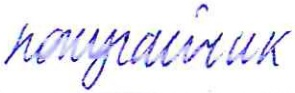попугайчик
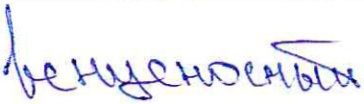венценосный
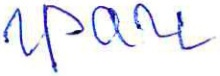грач
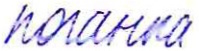поганка
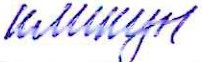кликун
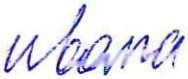ивапа
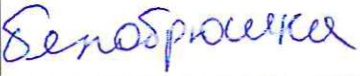белобрюшка
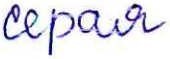серая
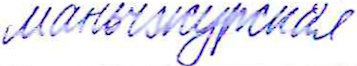маньчжурская
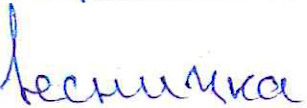весничка
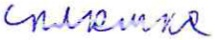сплюшка
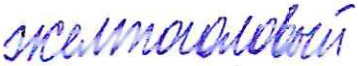желтоголовый
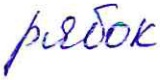рябок
